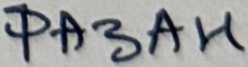фазан
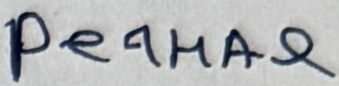речная
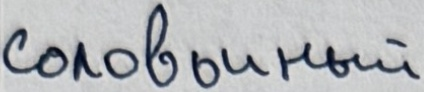соловьиный
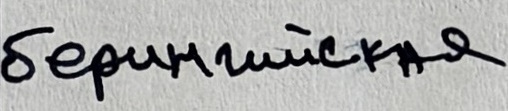берингийская
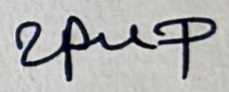гриф
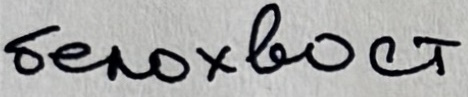белохвост
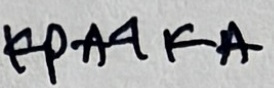крачка
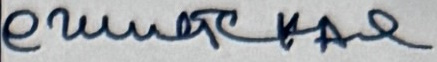египетская
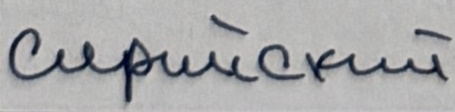сирийский
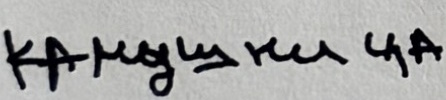камушни ца
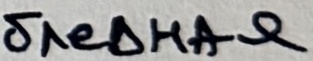бледная
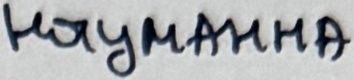науманна
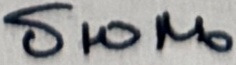бюль
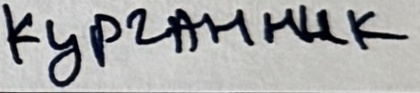курганник
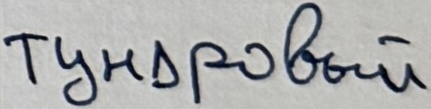тундровый
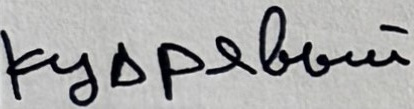кудрявый
